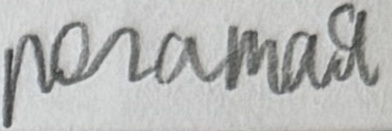рогатая
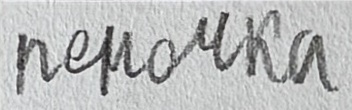пеночка
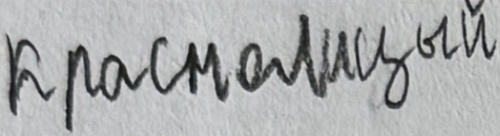краснолицый
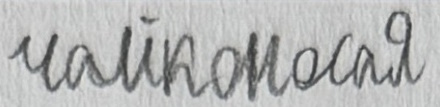чайконосая
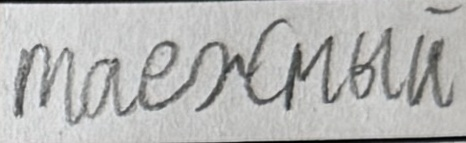таежный
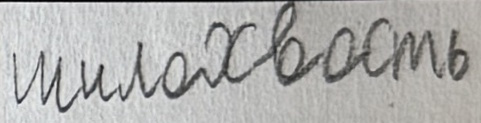шилохвость
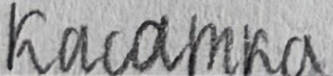касатка
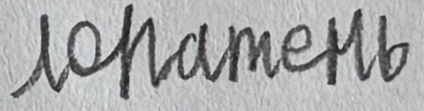лопатень
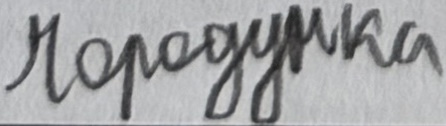мородунка
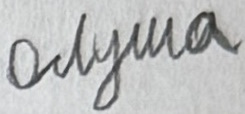олуша
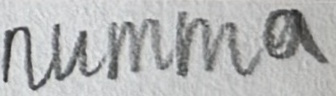питта
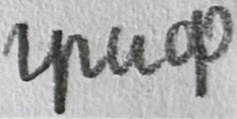гриф
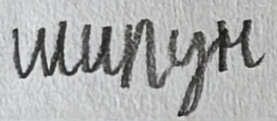шипун
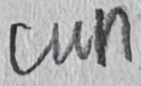сип
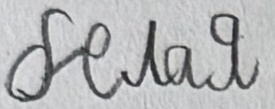белая
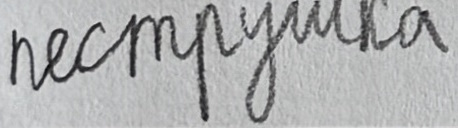пеструшка
